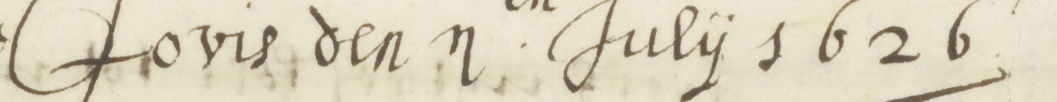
Jovis den ijen Julij 1626.
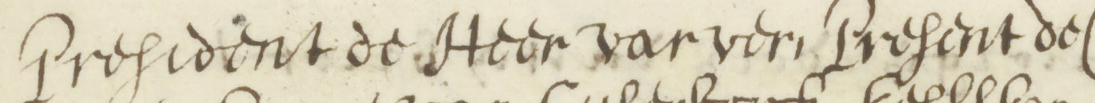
President de Heer Varver, present de
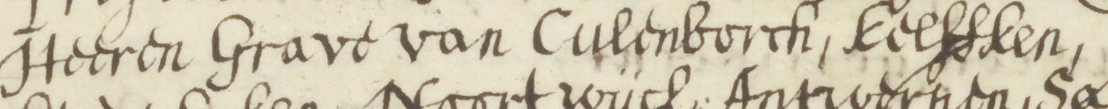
Heeren Grave van Culenborch, Kelffken,
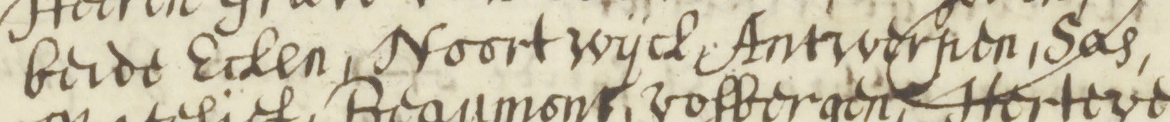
beide Ecken, Noortwijck, Antwerpen, Sas,
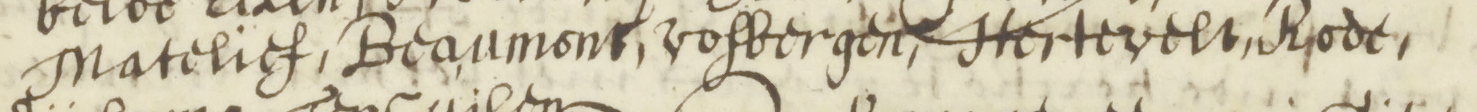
Matelief, Beaumont, Vosbergen, Hertevelt, Rode,
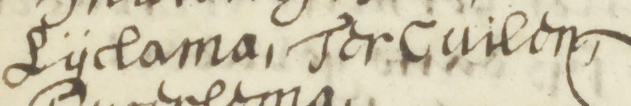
Lijclama, Ter Cuilen,
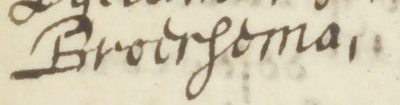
Broersema.
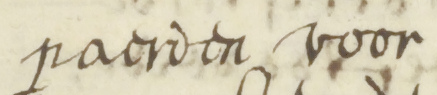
Paerden voor
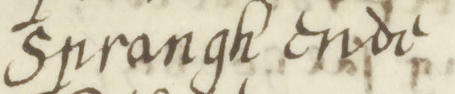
Sprangh ende
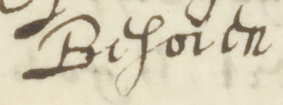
Besoien
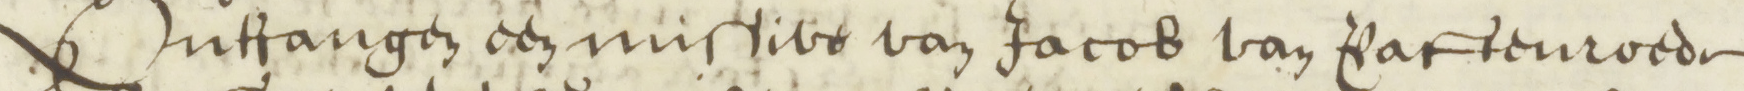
Ontfangen een missive van Jacob van Paffenroede
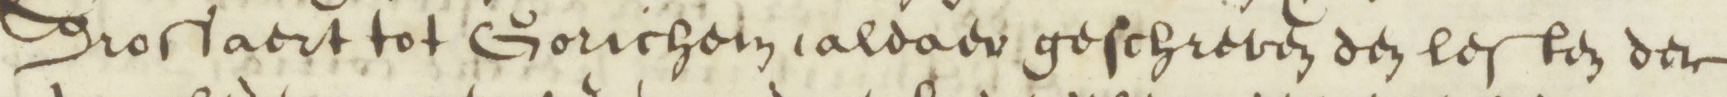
Drossaert tot Gorichem, aldaer geschreven den lesten der
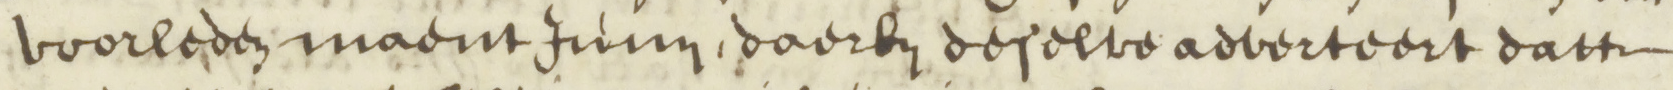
voorleden maent Junij, daerby deselve adverteert datte
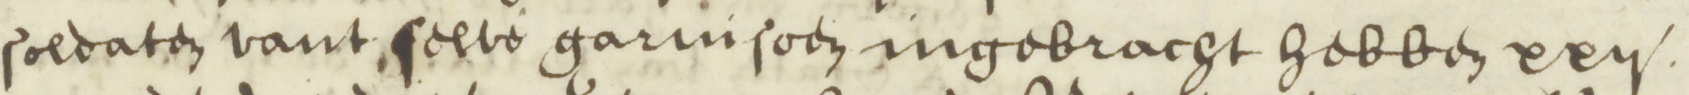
soldaten vant selve garnisoen ingebracht hebben xxij
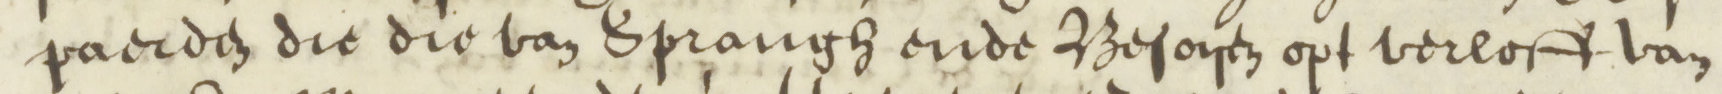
paerden die die van Sprangh ende Besoyen opt verloff van
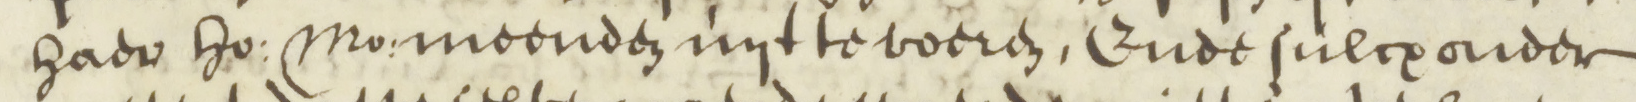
haer Ho:Mo: meenden uyt te voeren. Ende sulcx onder
